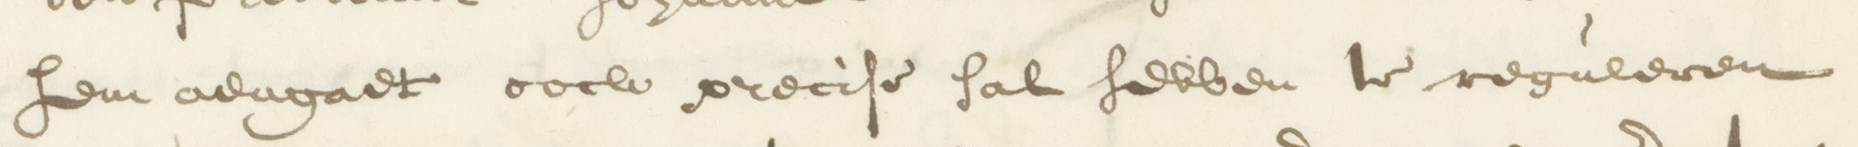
hem aengaet, oock precise sal hebben te reguleren
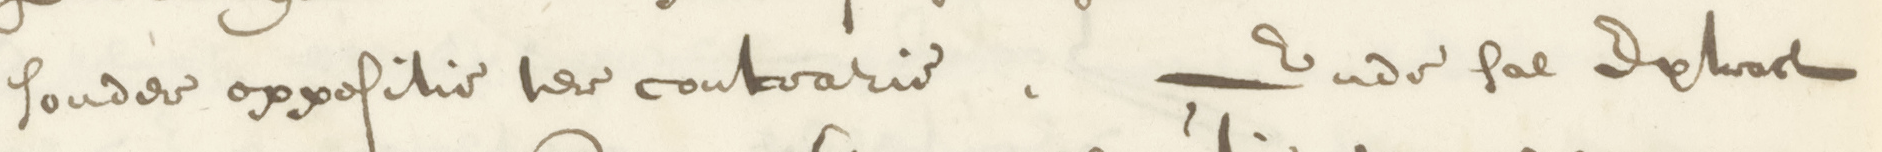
sonder oppositie ter contrarie. Ende sal Extract
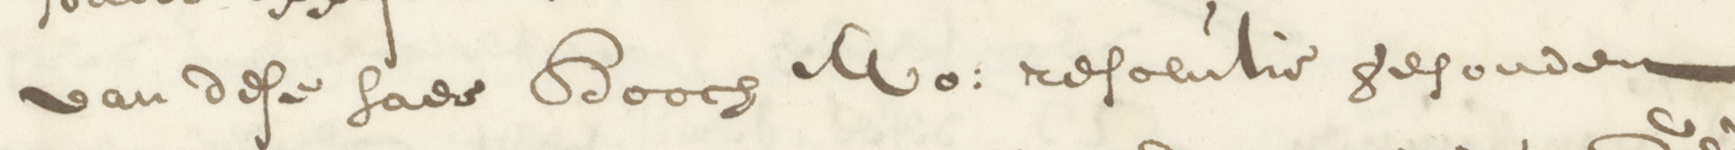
van dese haer Hooch Mo: resolutie gesonden
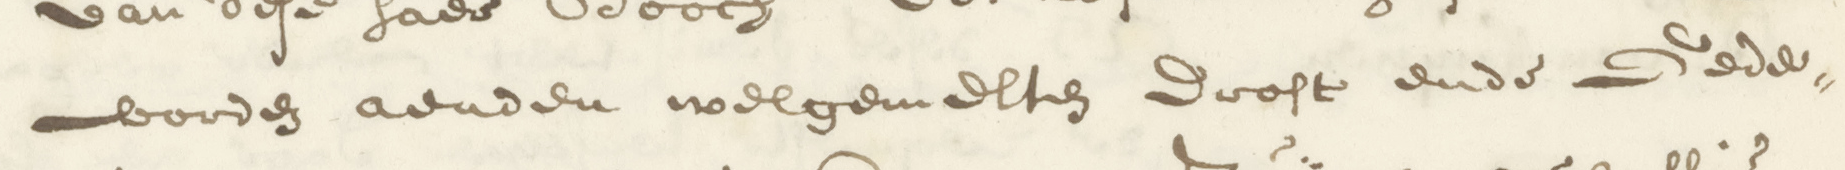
worden aenden welgemelten Drost ende Gede,,
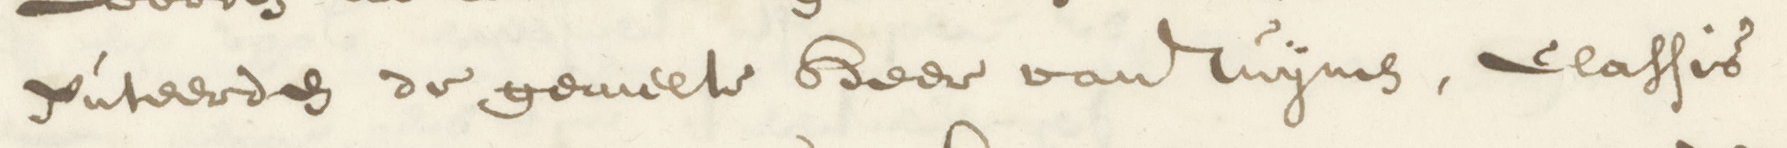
puteerden de gemelte Heer van Nuijnen, Classis
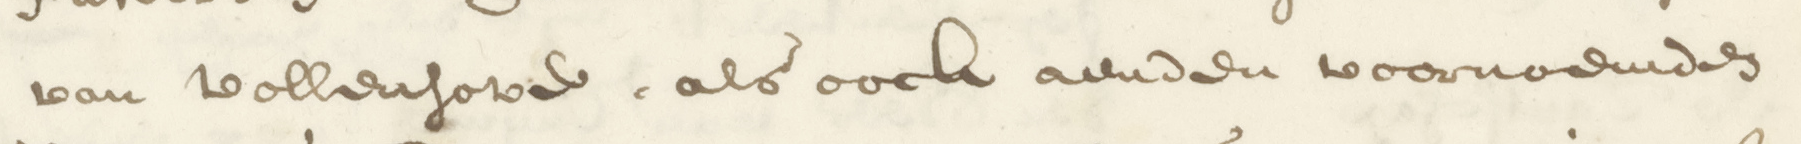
van vollenhove, als oock aenden voornoemden
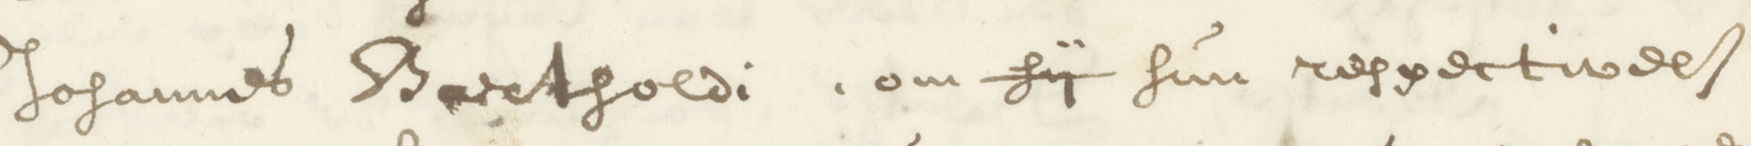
Johannes Bartholdi, om hij hun respectivel
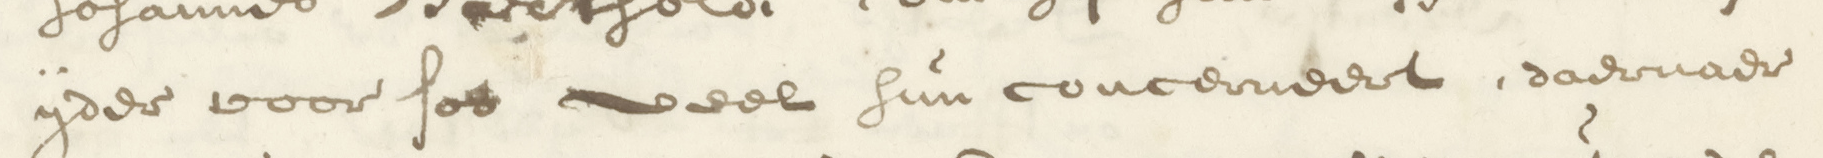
ijder voor soe veel hun concerneert, daernaer
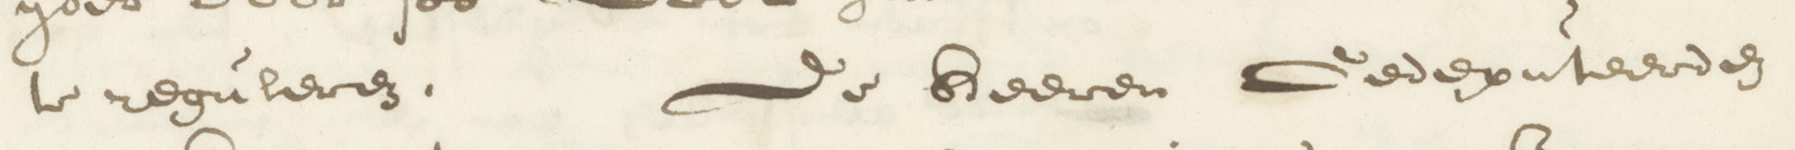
te reguleren. De heeren Gedeputeerden
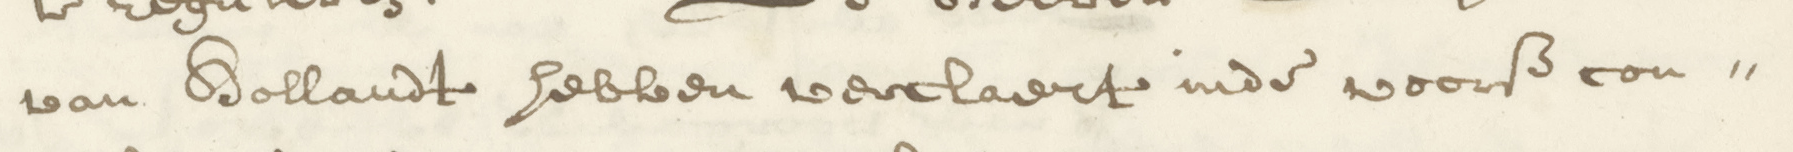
van Hollandt hebben verclaert inde voors con„
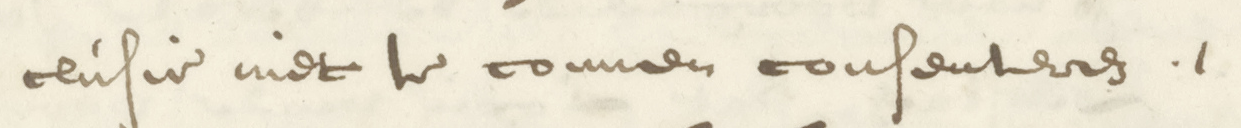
clusie niet te connen consenteren.
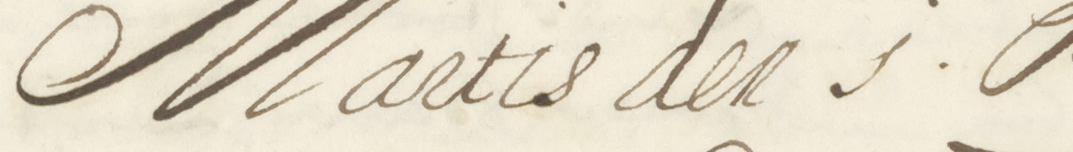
Martis den 1. Martij
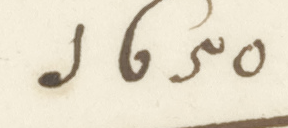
1650
